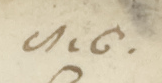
816.
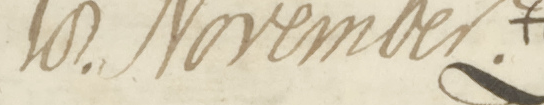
18. November.
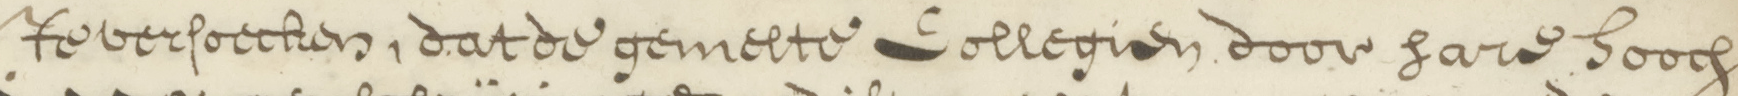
te versoecken, dat de gemelte Collegien door hare hooch
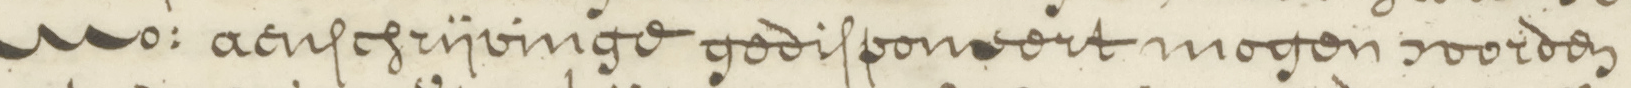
Mo: aenschrijvinge gedisponeert mogen worden
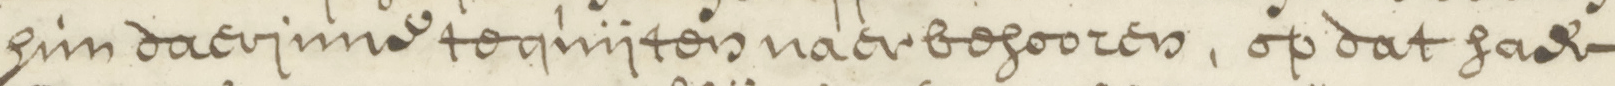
hun daerinne te quijten naer behooren, op dat haer
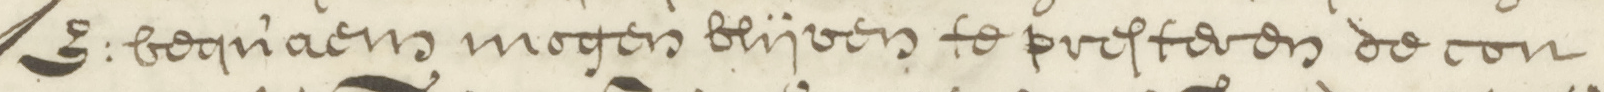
E: bequaem mogen blijven te presteren de con„
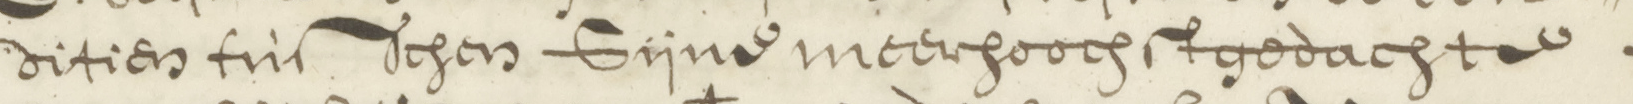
ditien tusschen Sijne meerhoochstgedachte
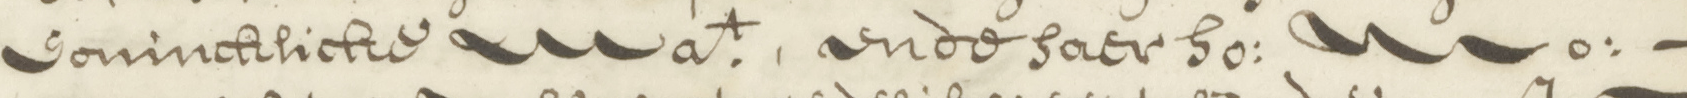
Conincklicke Mat., ende haer ho:Mo: -
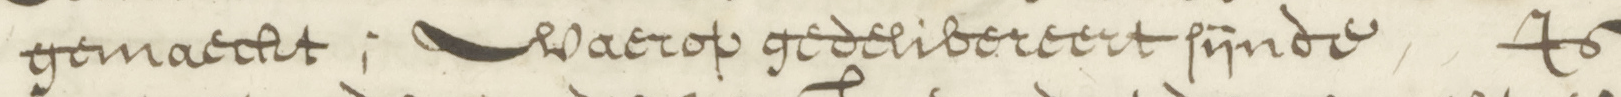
gemaeckt; Waerop gedelibereert sijnde, Is
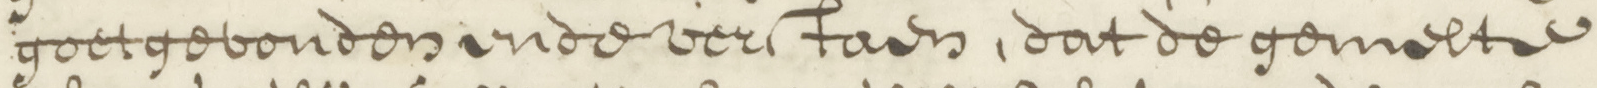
goetgevonden ende verstaen, dat de gemelte
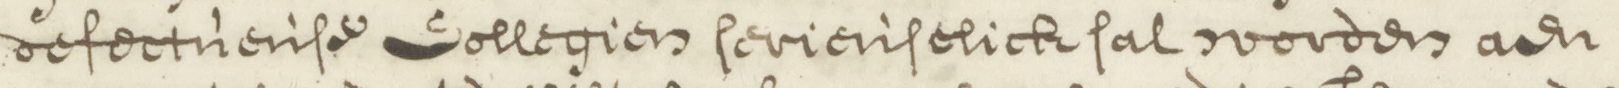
defectueuse Collegien serieuselick sal worden aen„
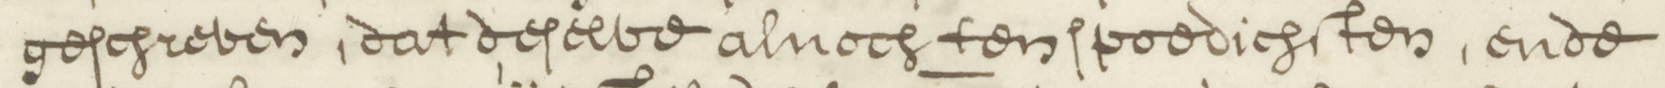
geschreven, dat deselve alnoch ten spoedichsten, ende
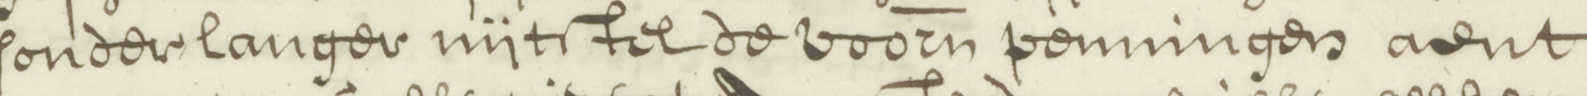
sonder langer uijtstel de voorn penningen aent
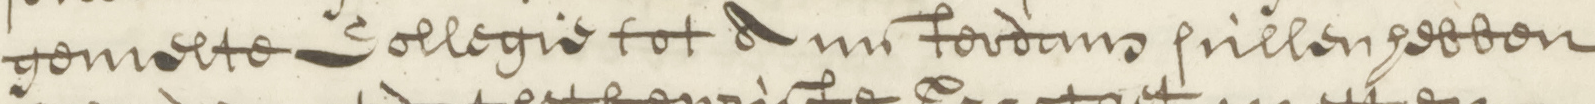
gemelte Collegie tot Amsterdam sullen hebben
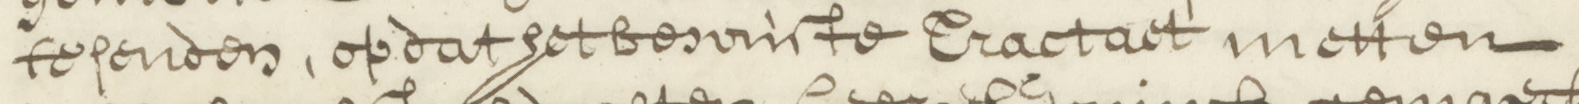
te senden, op dat het bewuste Tractaet metten
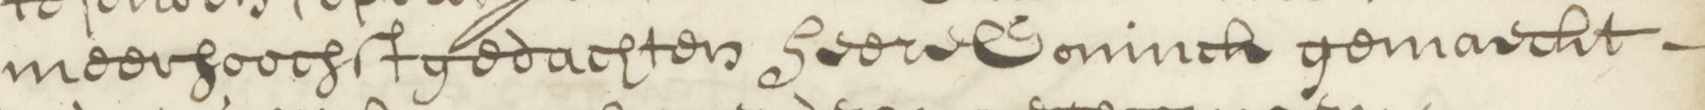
meerhoochstgedachten heere Coninck gemaeckt -
